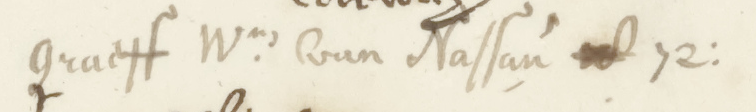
graeff Wm. van Nassau 18 72:
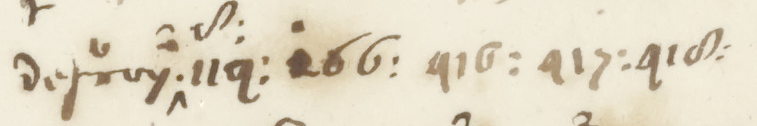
defroy.^8 119: 266: 416: 417: 418:
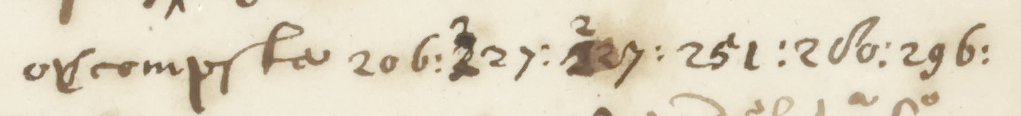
ovcompste 206: 2227: 2227: 251: 280: 296:
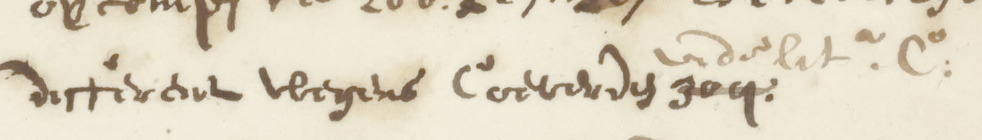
dicteren wegens Coeverden 304: vide lita. Co:
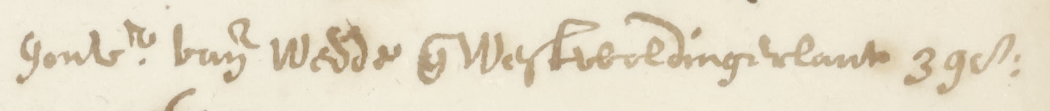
gouvr. van Wedde & Westwoldingerlant 398:
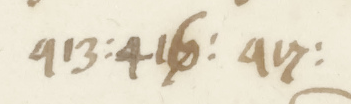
413: 416: 417:
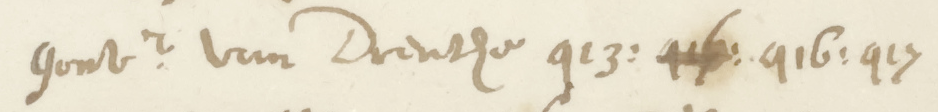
gouvr. van Drenthe 413: 416: 416: 417
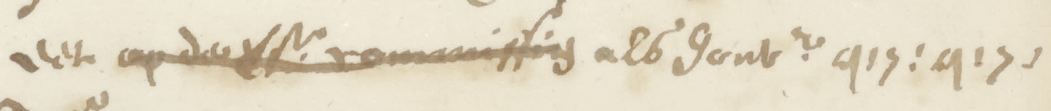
eet op den vs commissien als gouvr. 417: 417:
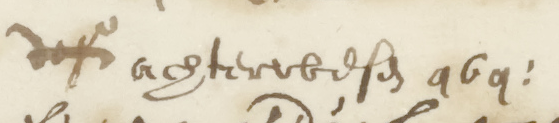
desr achterwesen 464:
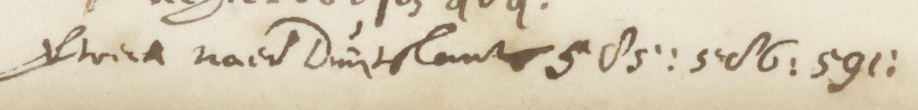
vtreck naer Duijtslant 585: 586: 591:
